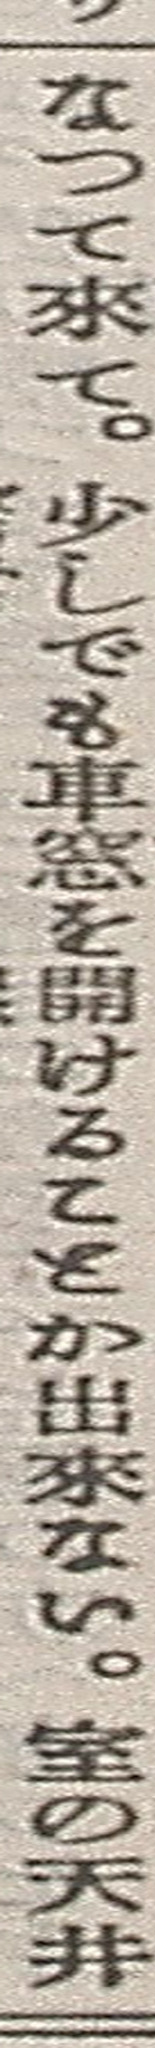なつて来て。少しでも車窓を開けることか出来ない。室の天井
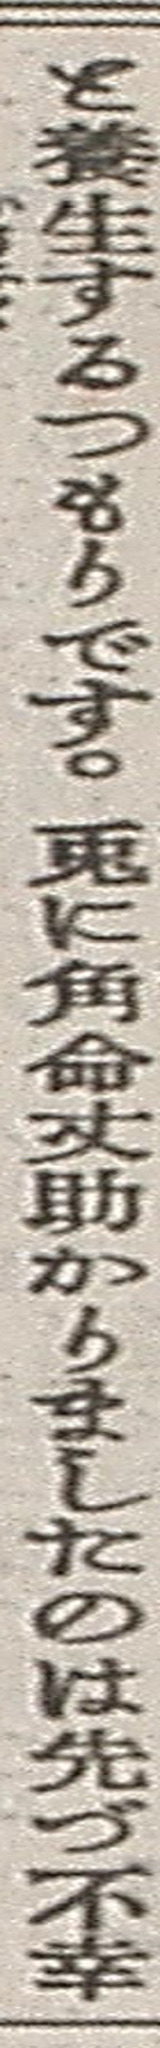と養生するつもりです。兎に角命丈助かりましたのは先づ不幸
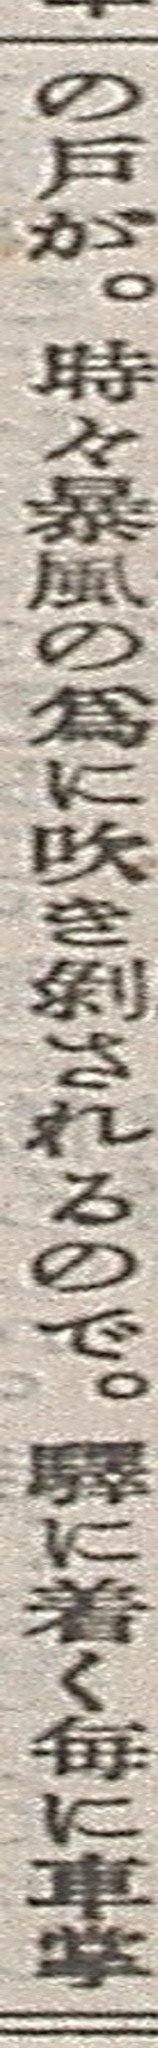の戸が。時々暴風の為に吹き剥されるので。駅に着く毎に車掌
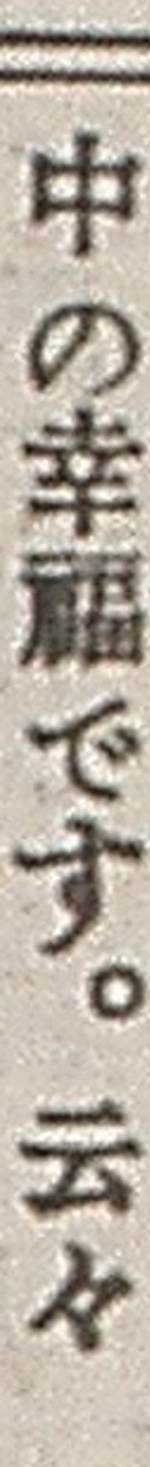中の幸福です。云々。
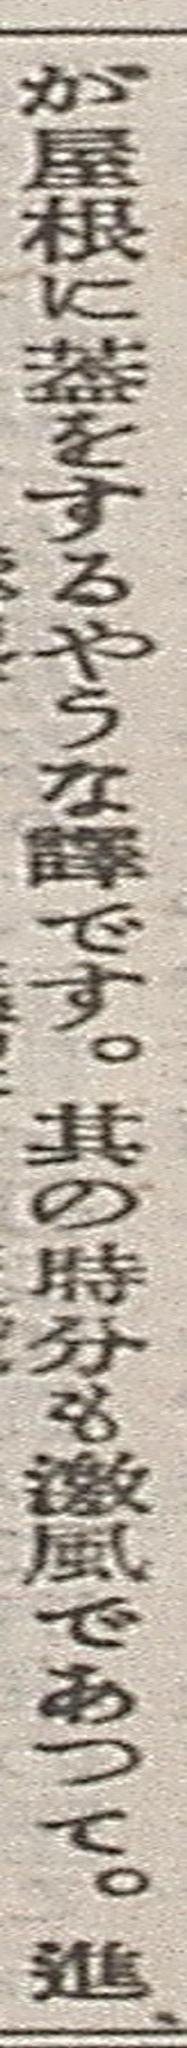が屋根に蓋をするやうな訳です。其の時分も激風であつて。進
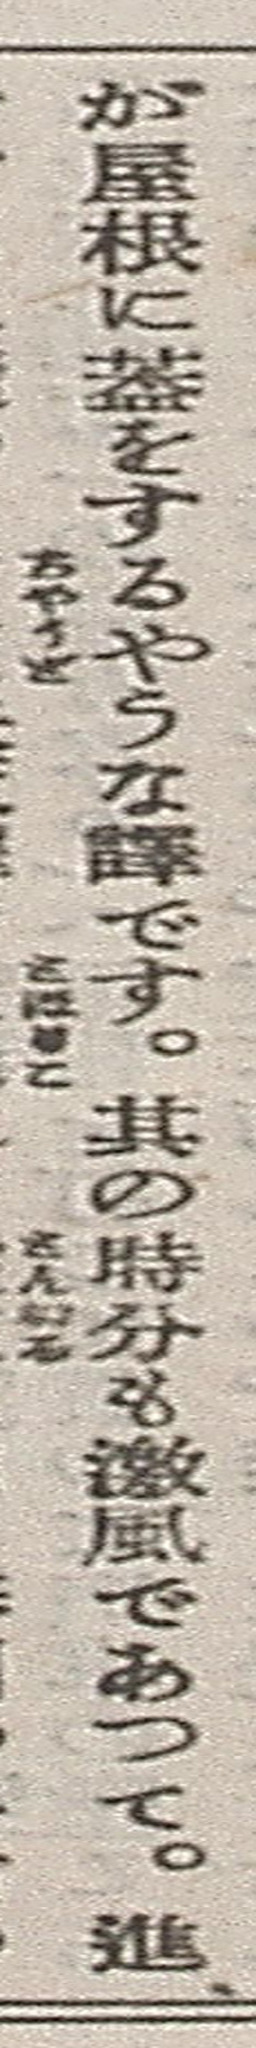が屋根に蓋をするやうな訳です。其の時分も激風であつて。進
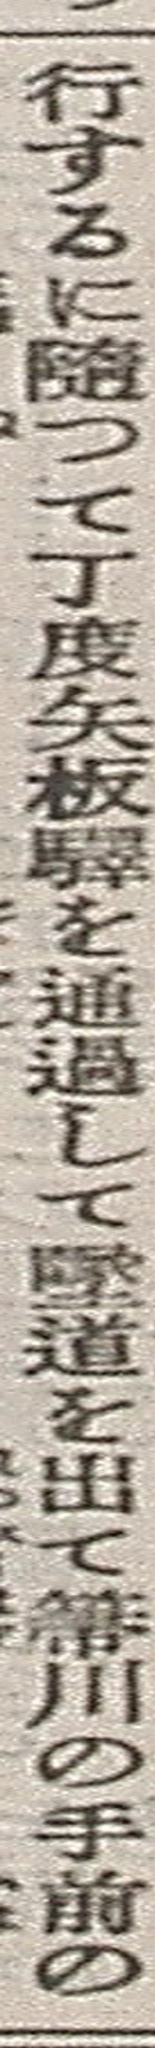行するに随つて丁度矢板駅を通過して隧道を出て箒川の手前の
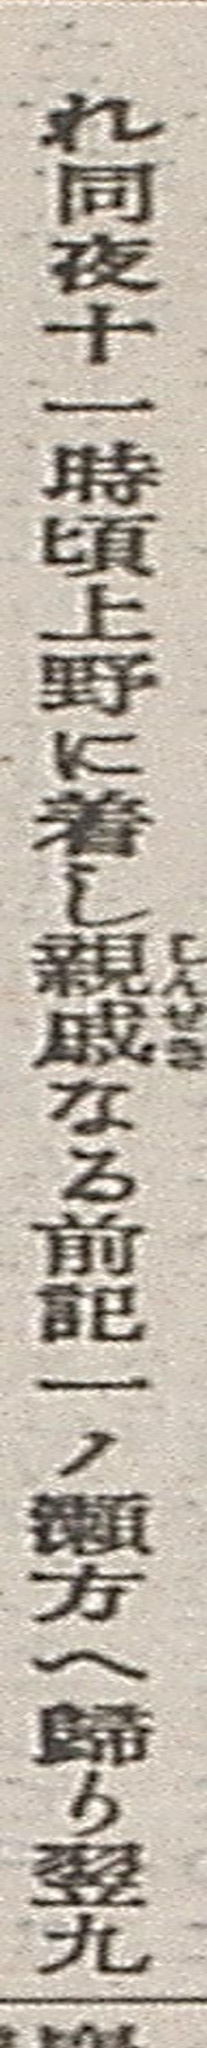れ同夜十一時頃上野に着し親戚なる前記一ノ瀬方へ帰り翌九
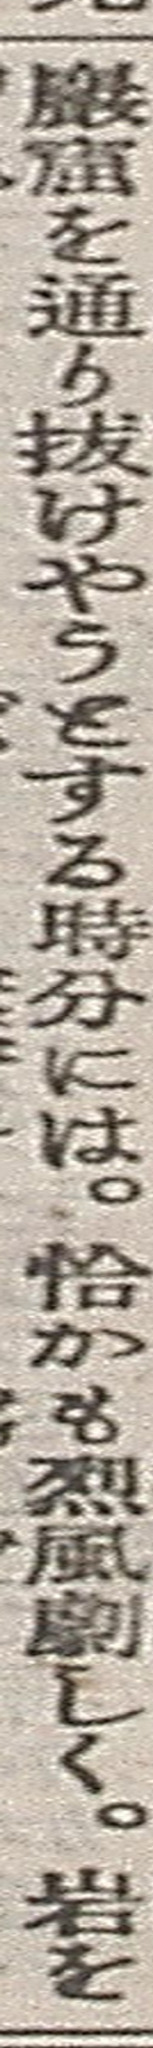巌窟を通り抜けやうとする時分には。恰かも烈風劇しく。岩を
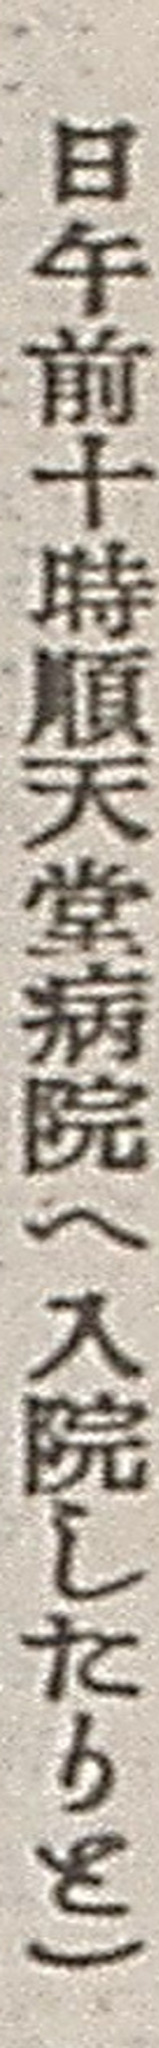日午前十時順天堂病院へ入院したりと）
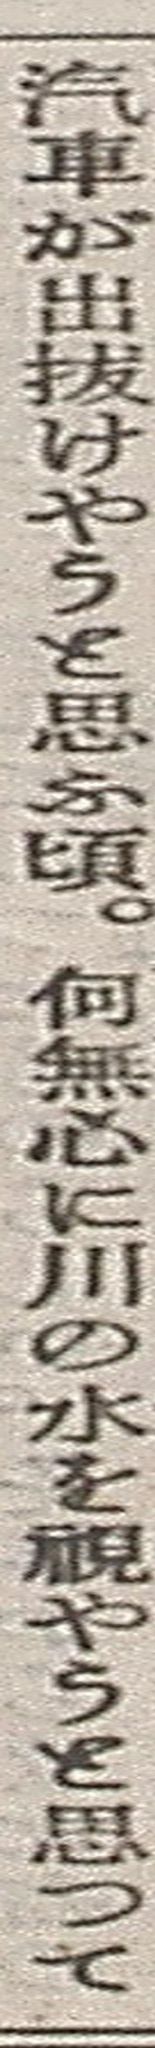汽車が出抜けやうと思ふ頃。何無心に川の水を視やうと思つて
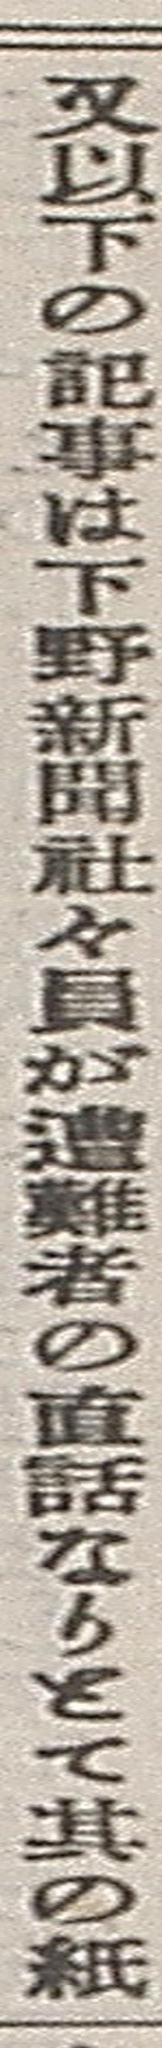又以下の記事は下野新聞社々員が遭難者の直話なりとて其の紙
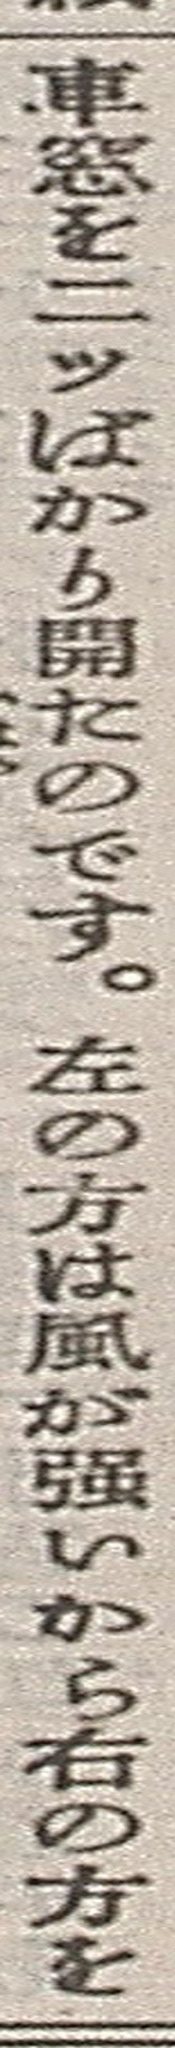車窓を二ツばかり開たのです。左の方は風が強いから右の方を
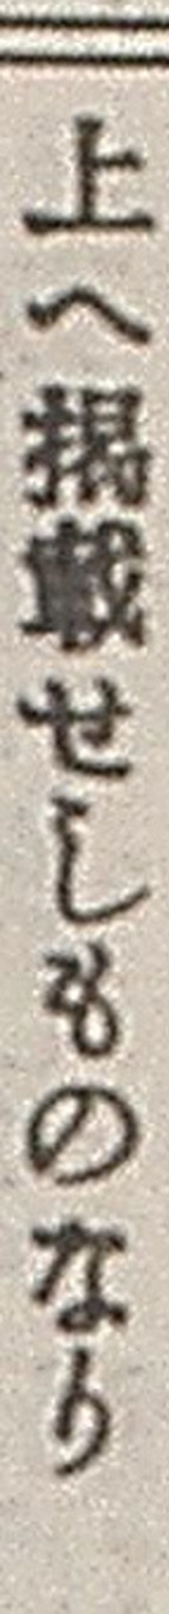上へ掲載せしものなり。
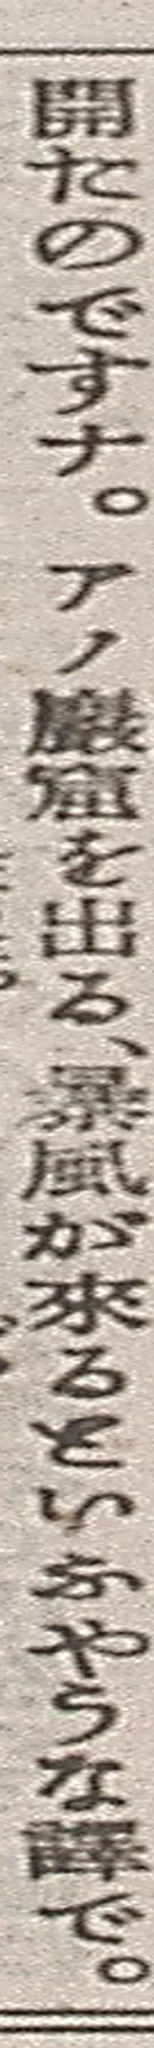開たのですナ。アノ巌窟を出る、暴風が来るといふやうな訳で。
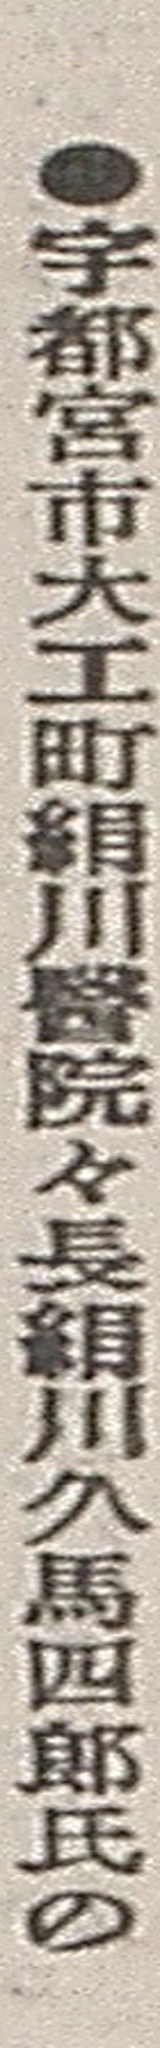●宇都宮市大工町絹川医院々長絹川久馬四郎氏の
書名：風俗畫報臨時増刊第百九十九號　明治三十二年十月各地災害圖會（前編之續）
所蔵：東京大学地震研究所図書室 Earthquake Research Institute Library, The University of Tokyo, JAPAN
